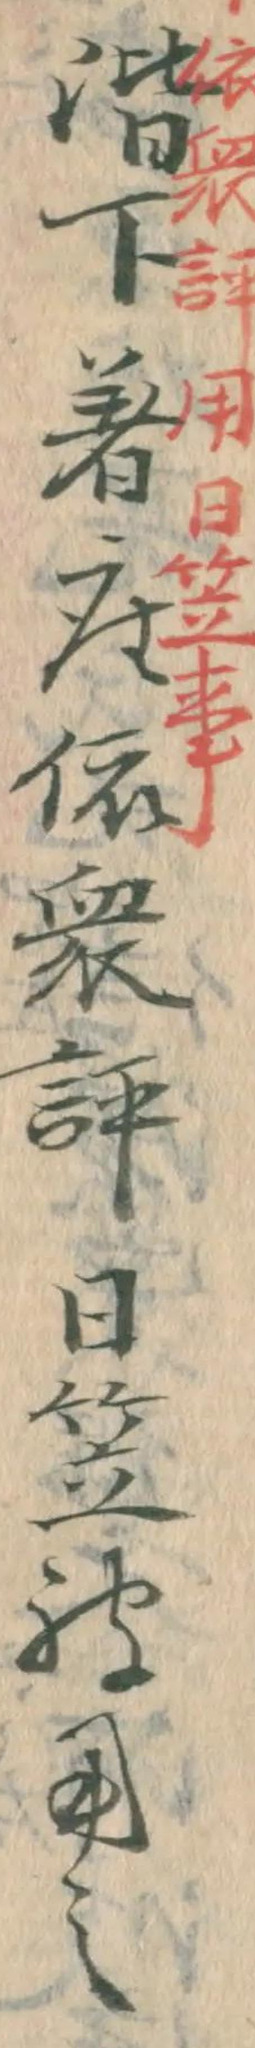階下着座依衆評日笠被用之
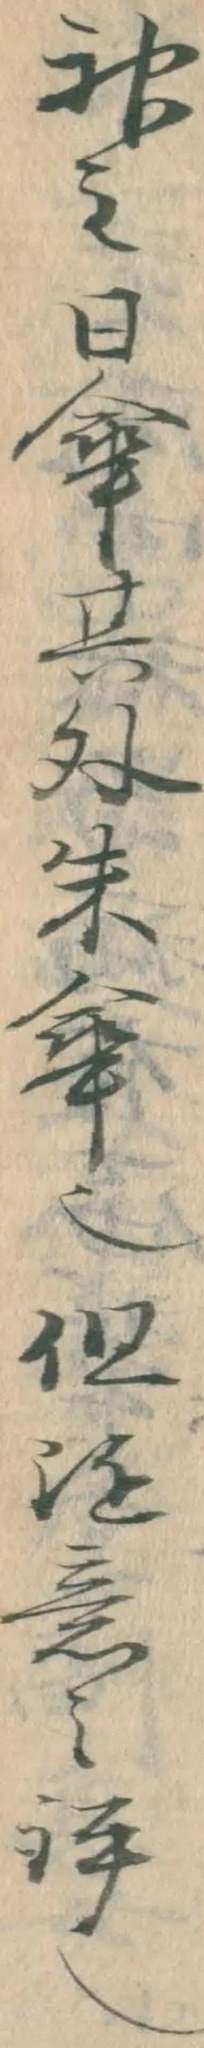神主日傘其外朱傘也但随意之評也

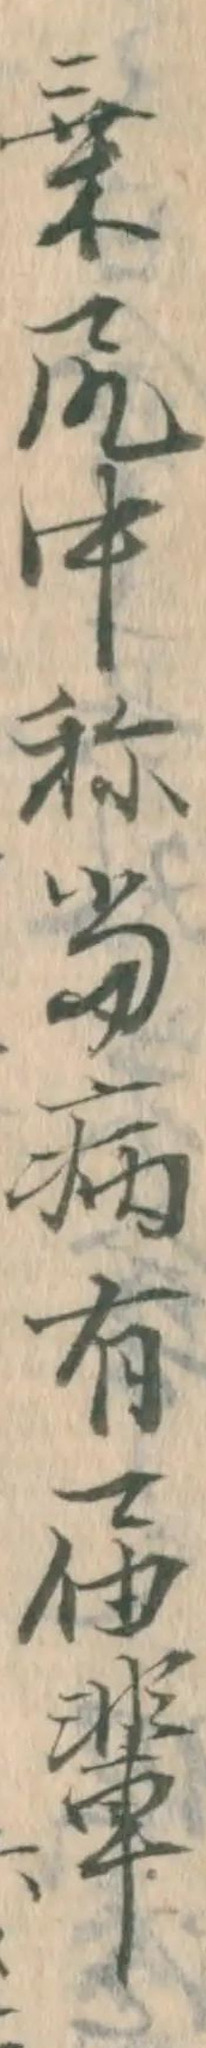乗尻中称当病有届輩
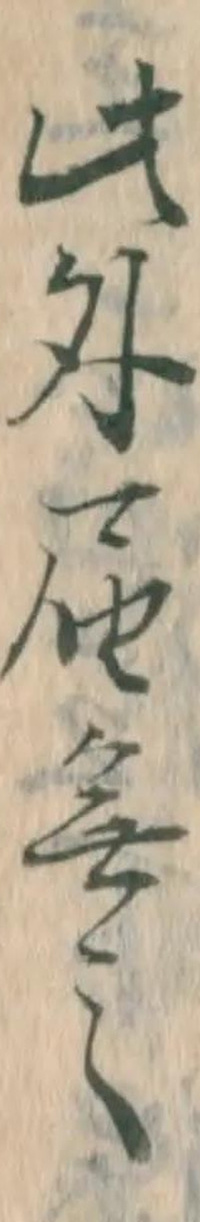此外届無之
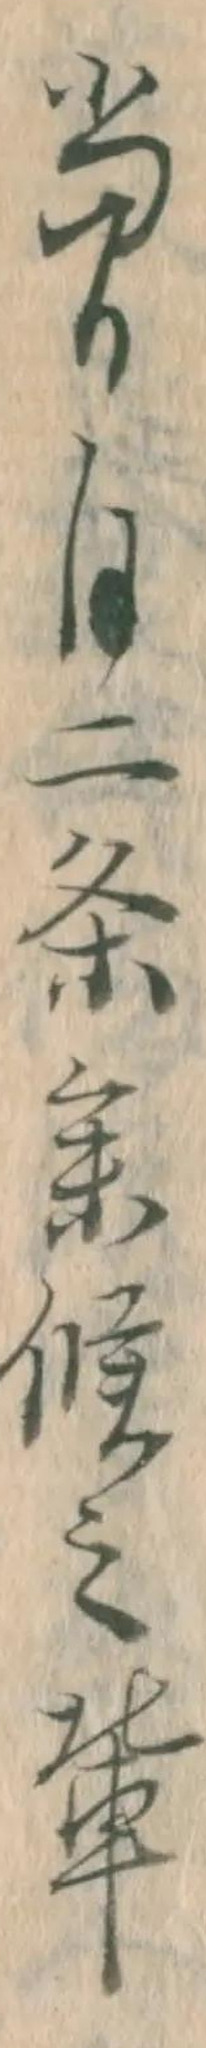当日自二条参候之輩
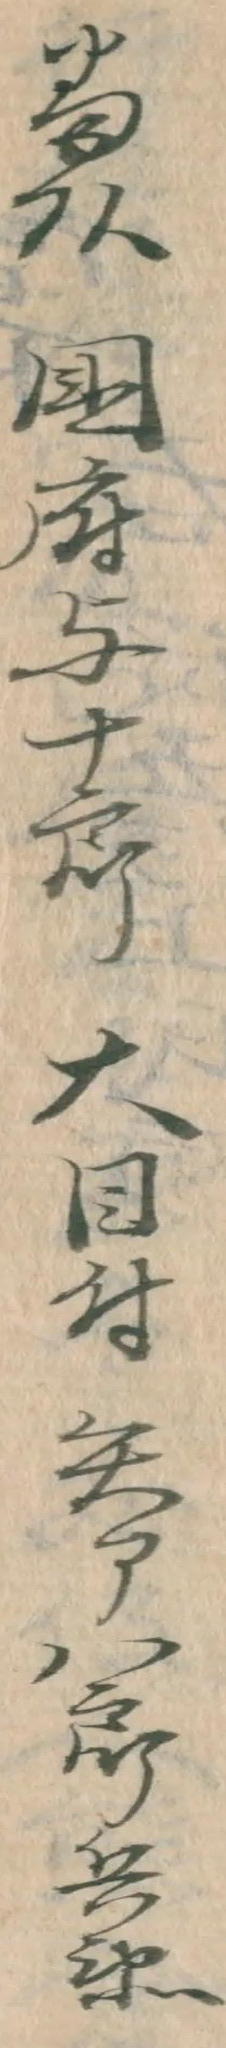番頭国府与十郎大目付矢部八郎兵衛
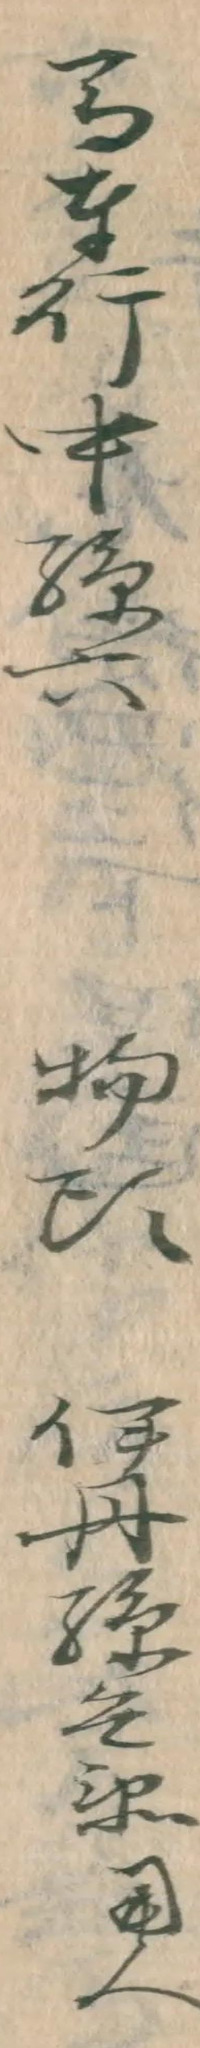馬奉行中孫六物頭伊丹孫兵衛用人
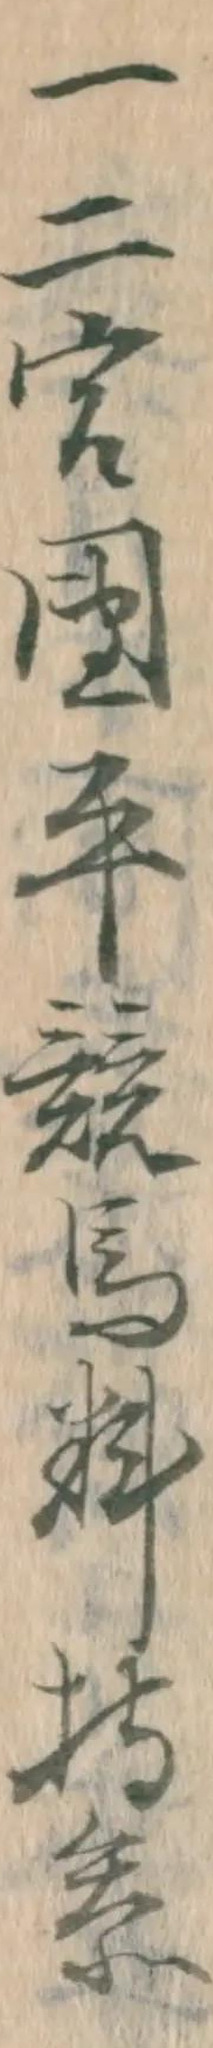一二宮国平競馬料持参
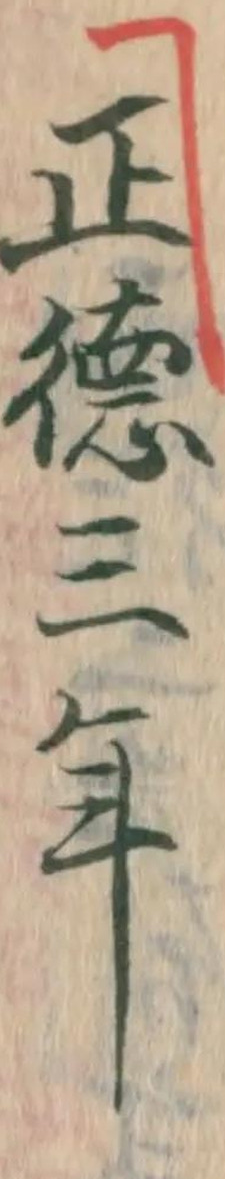正徳三年
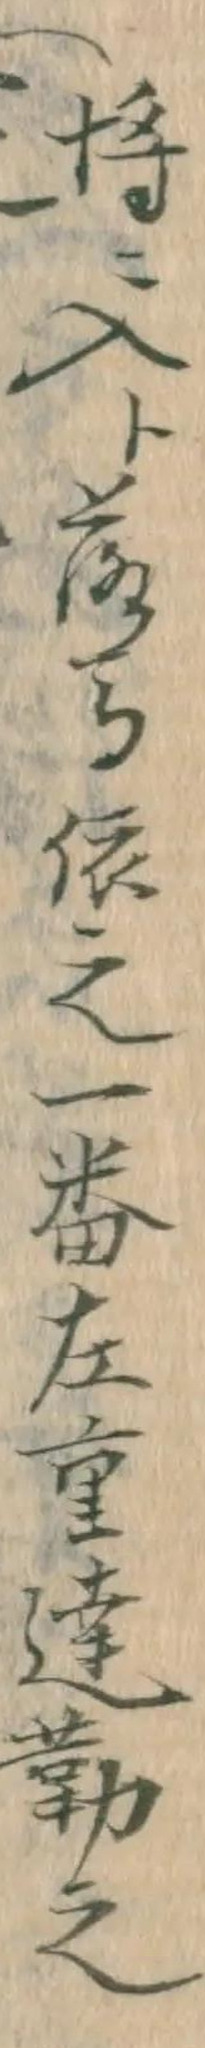(将ニ入ト落馬依之一番左重達勤之
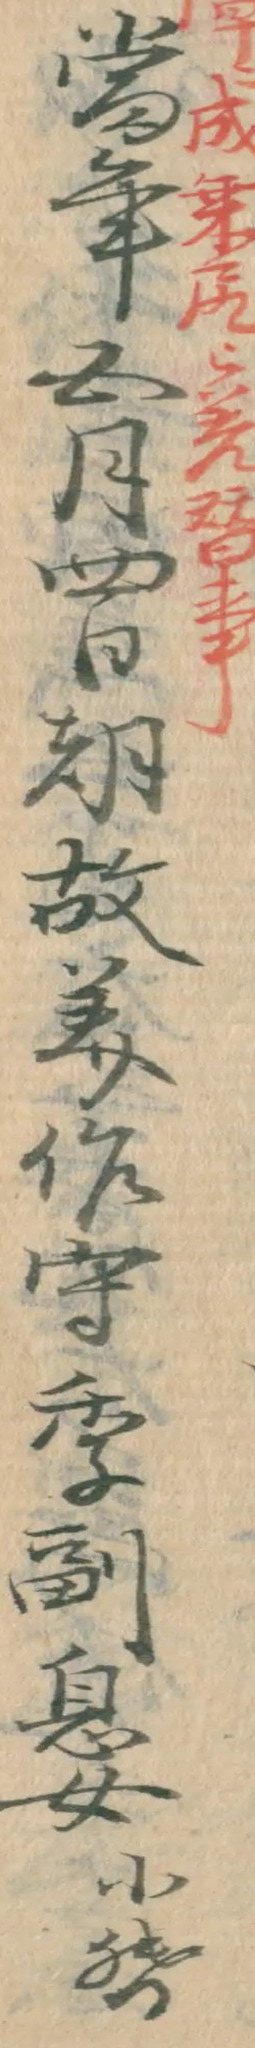当年五月四日朝故美作守季副息女小勢

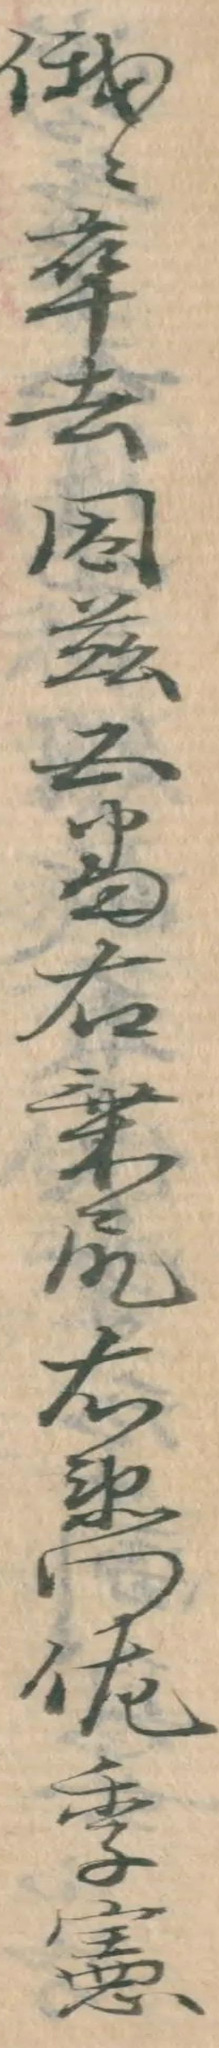俄ニ卒去因茲五番右乗尻右衛門佐季憲
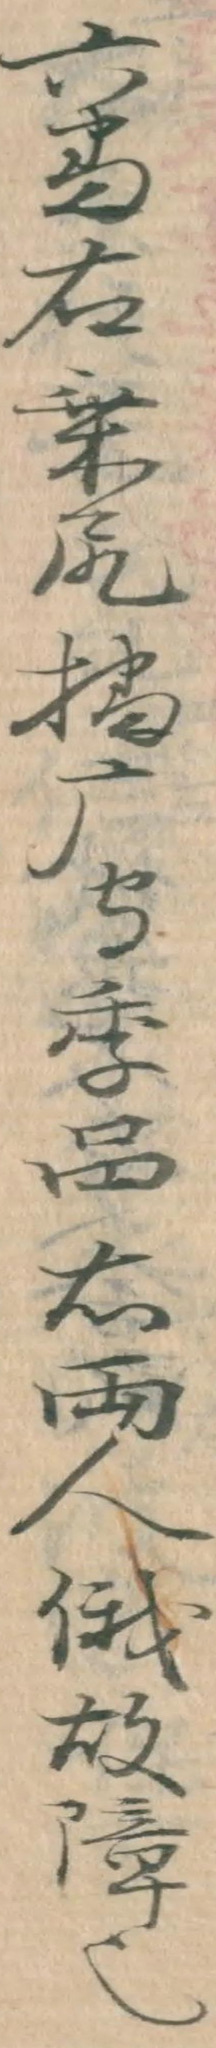六番右乗尻播磨守季品右両人俄故障也
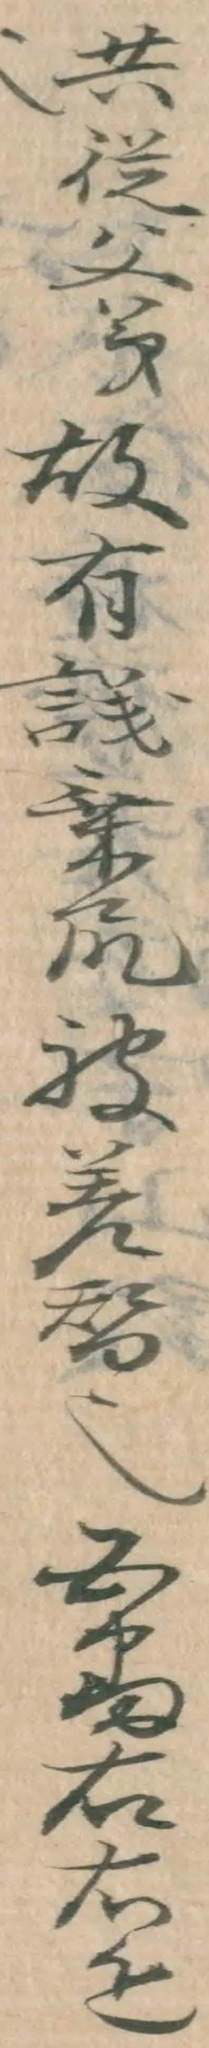共従父弟也故有議乗尻被差替也五番右右近
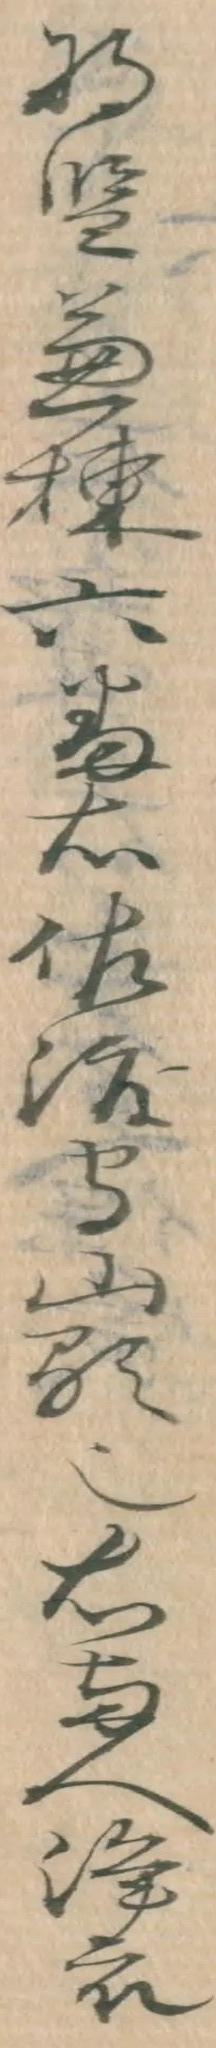将監兼棟六番右佐渡守山顕也右両人浄衣
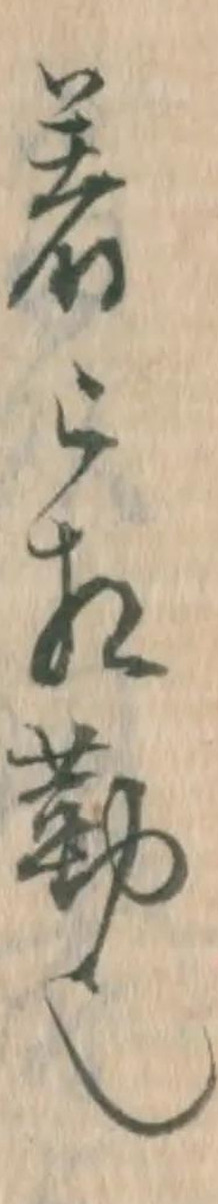着被相勤也
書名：賀茂社記録. 第10冊
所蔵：国立国会図書館 National Diet Library, JAPAN
